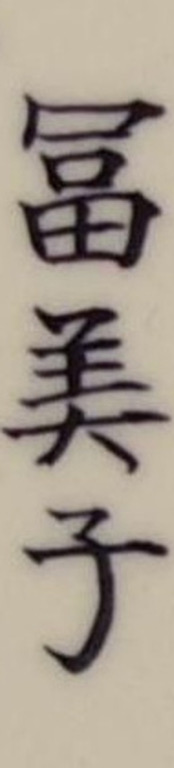冨美子
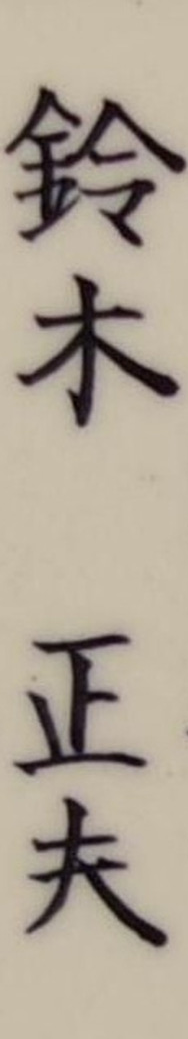鈴木正夫
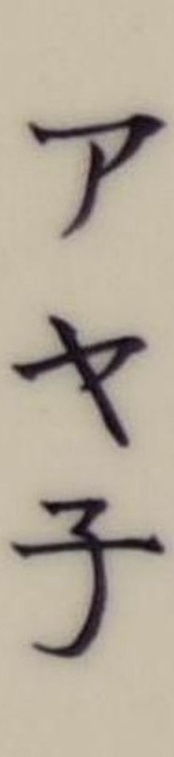アヤ子

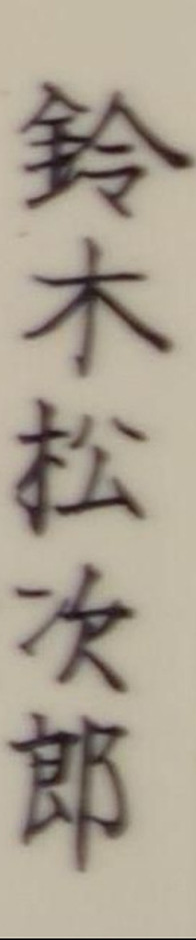鈴木松次郎
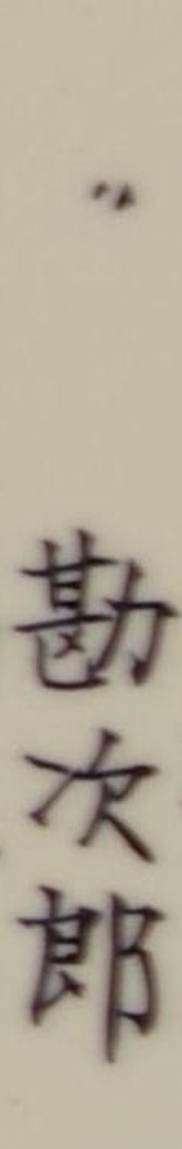勘次郎
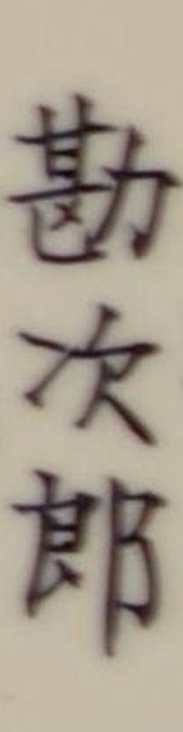勘次郎
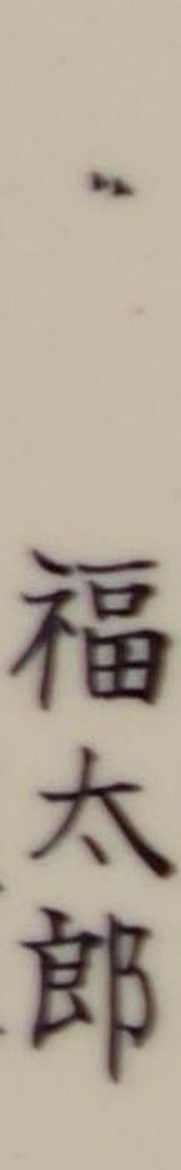福太郎
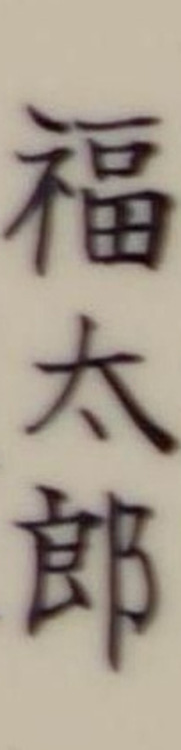福太郎
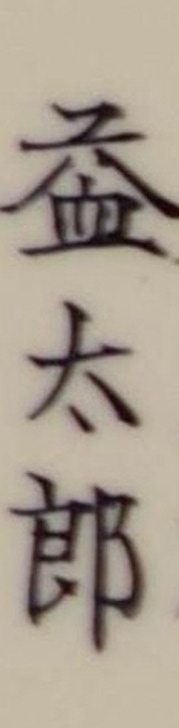益太郎
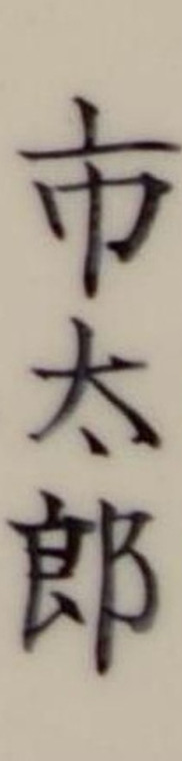市太郎
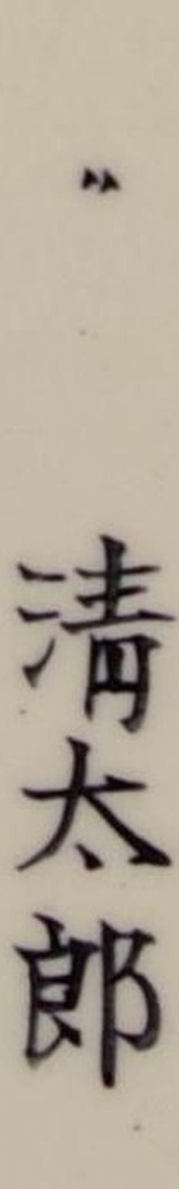清太郎
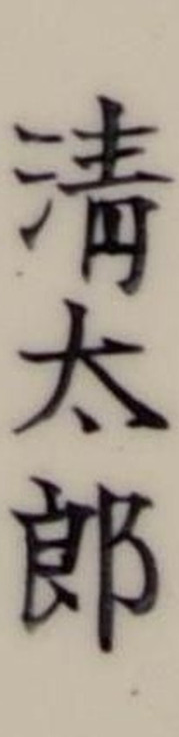清太郎
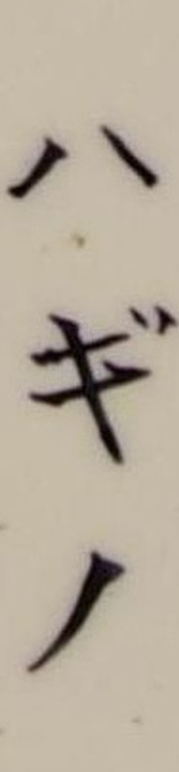ハギノ
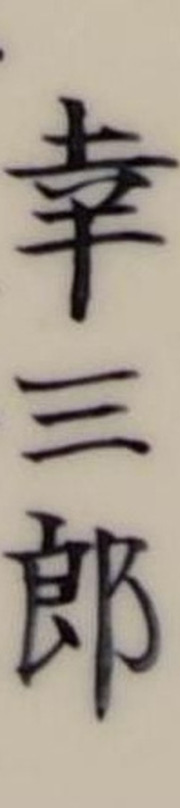幸三郎
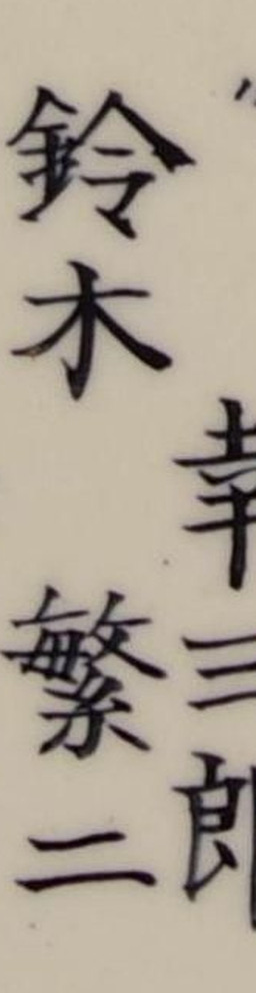鈴木繁二
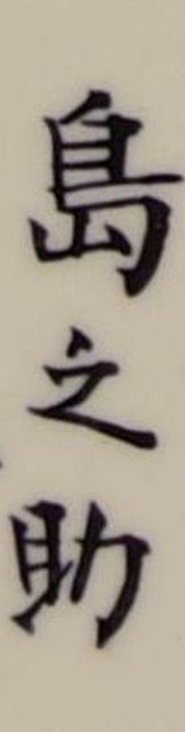島之助
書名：M~S
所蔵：高野山金剛峯寺
